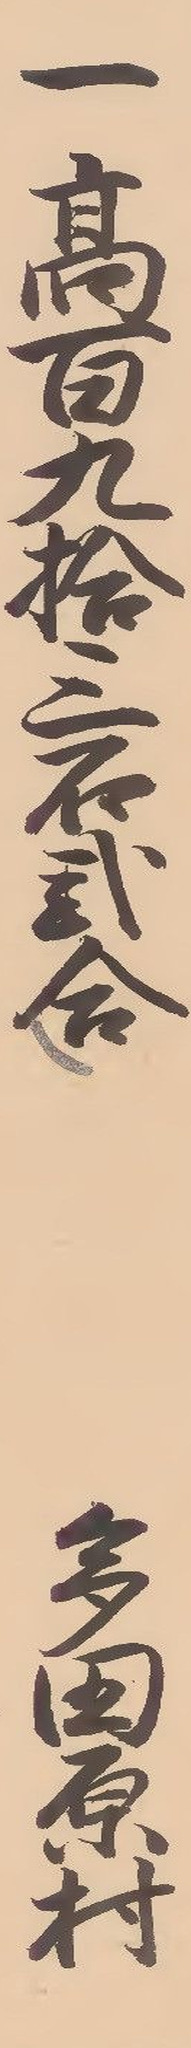一髙百九拾三石弐合多田原村

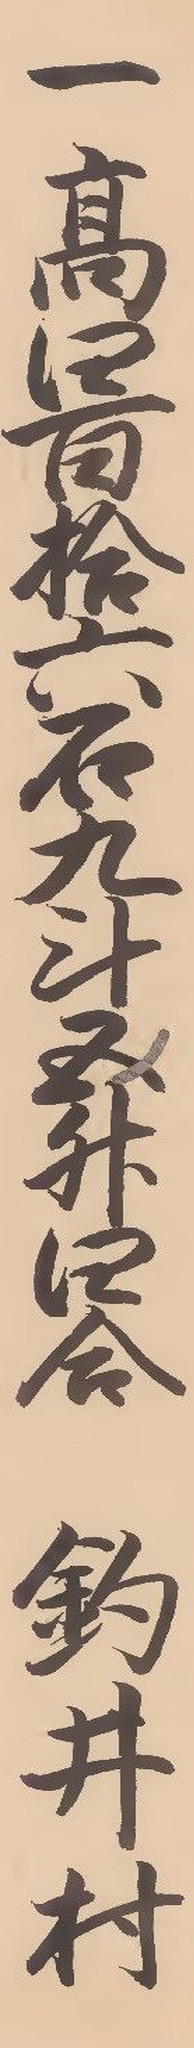一髙四百拾六石九斗五升四合釣井村
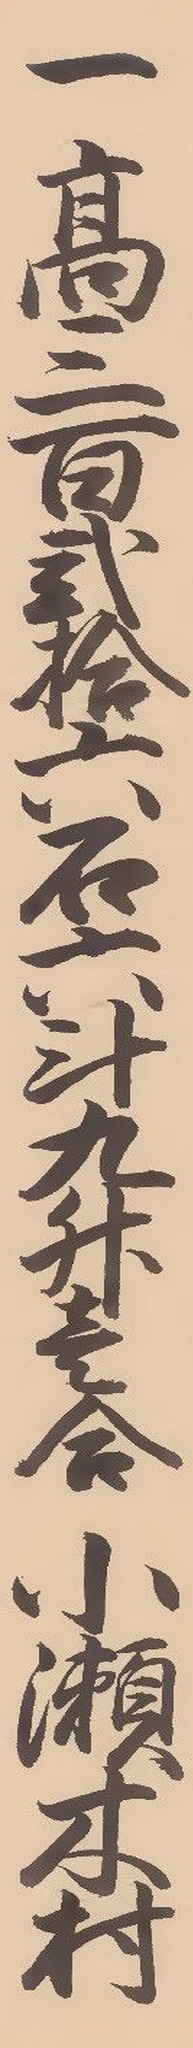一髙三百弐拾六石六斗九升壱合小瀬木村
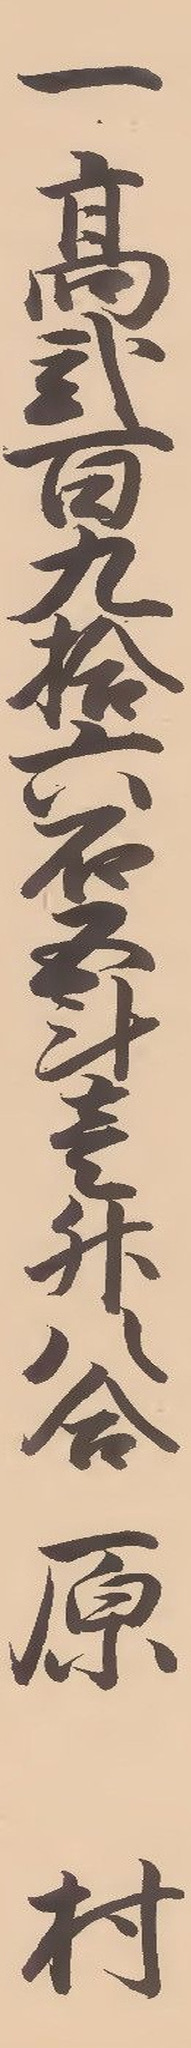一髙弐百九拾六石五斗壱升八合原村
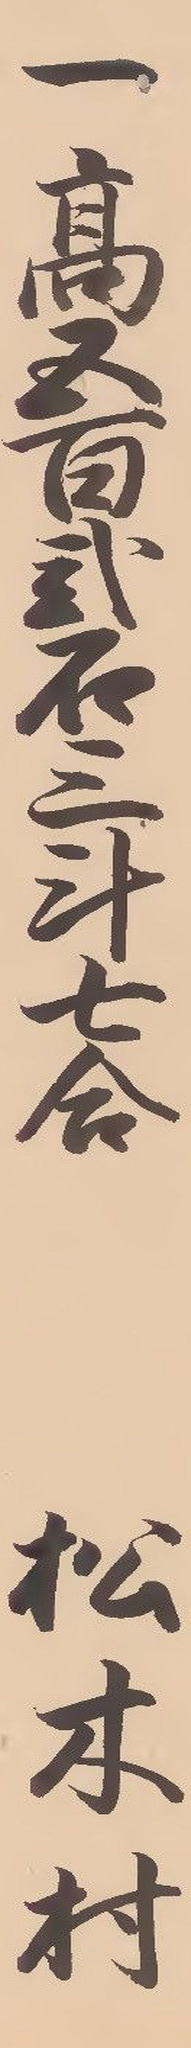一髙五百弐石三斗七合松木村
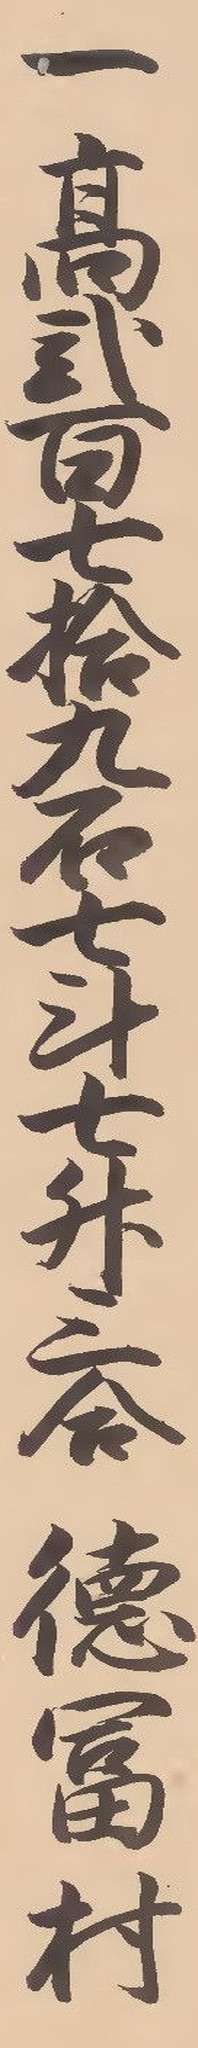一髙弐百七拾九石七斗七升三合徳冨村
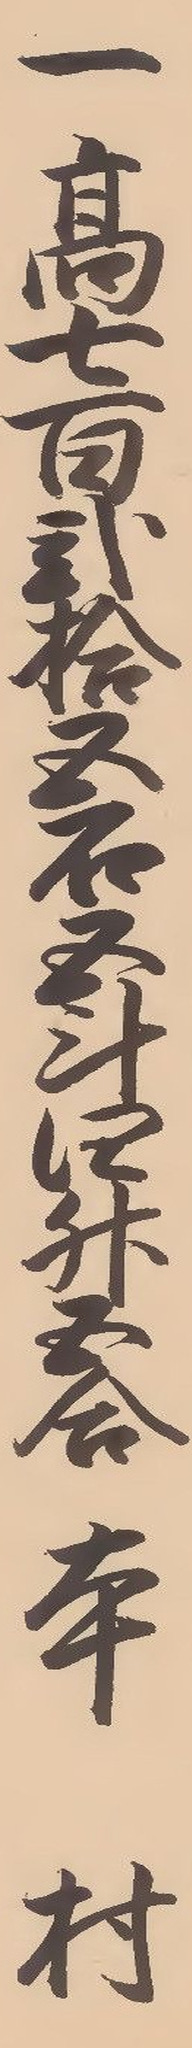一髙七百弐拾五石五斗四升五合本村
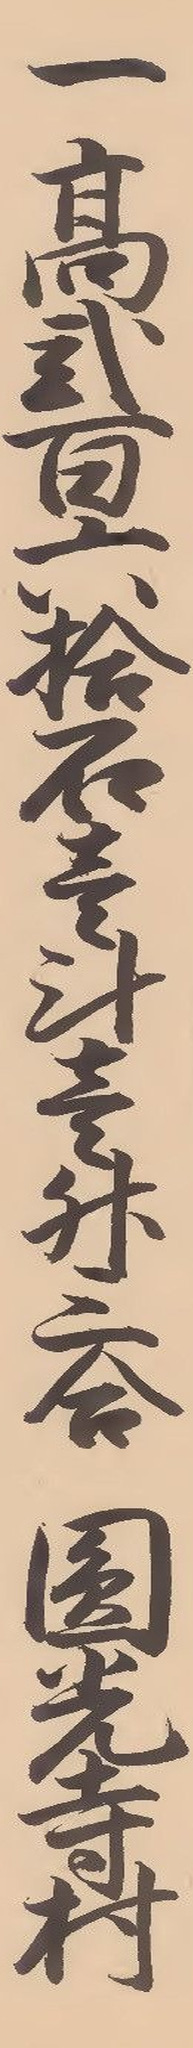一髙弐百六拾石壱斗壱升三合圓光寺村
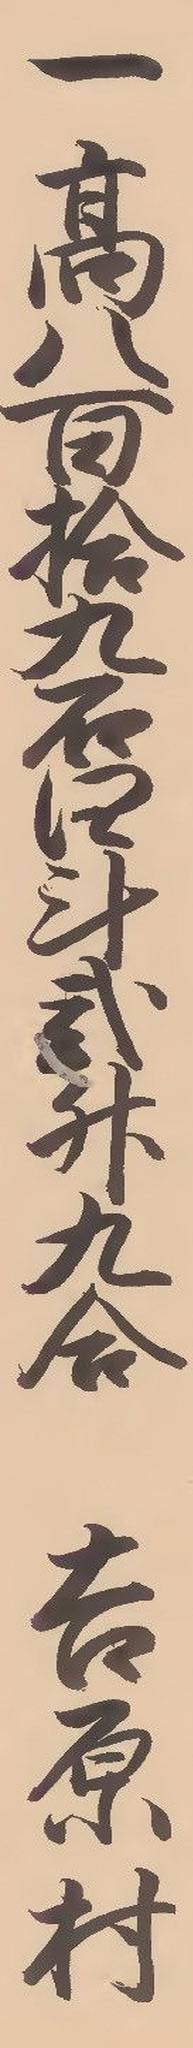一髙八百拾九石四斗弐升九合吉原村

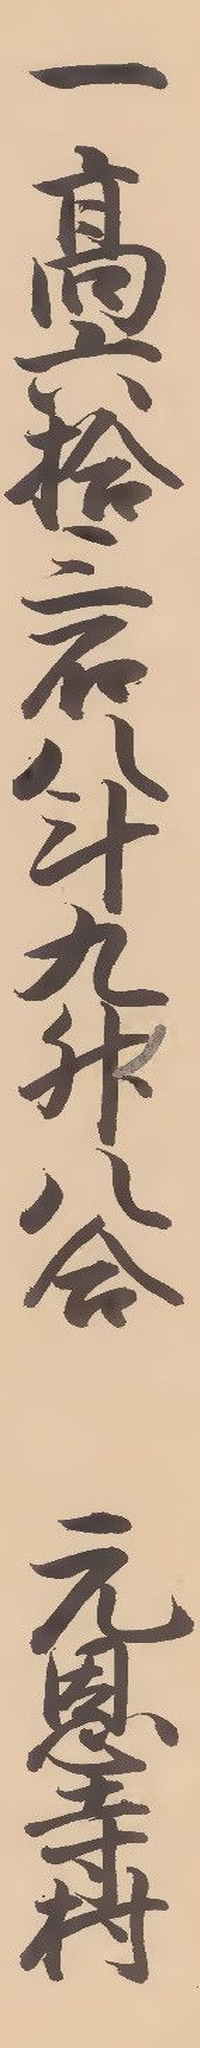一髙六拾三石八斗九升八合元恩寺村
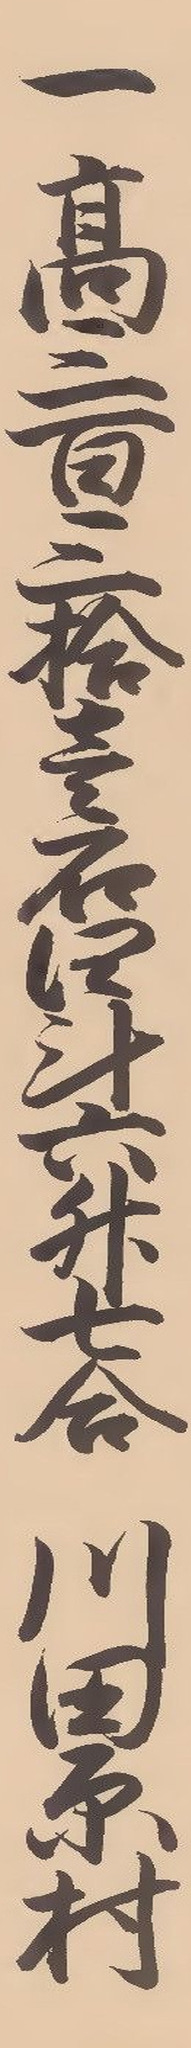一髙三百三拾壱石四斗六升七合川田原村
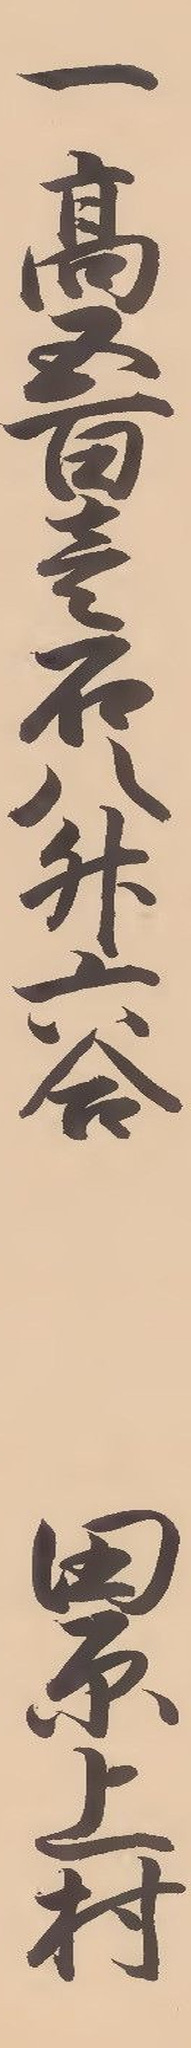一髙五百壱石八升六合田原上村
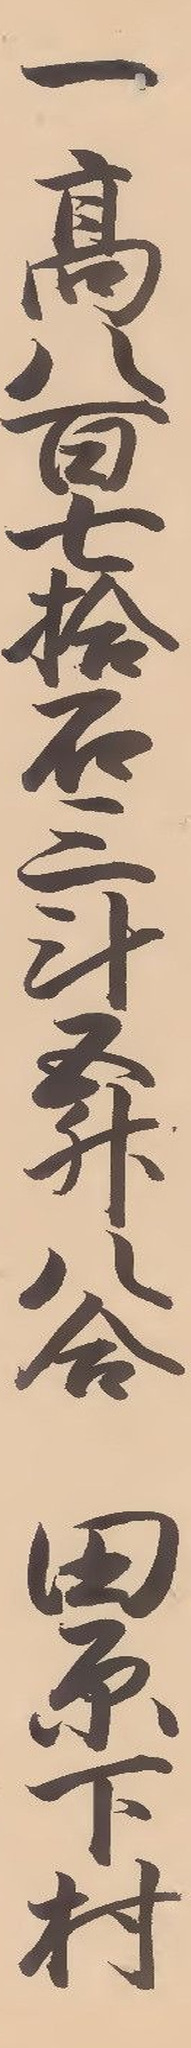一髙八百七拾石三斗五升八合田原下村
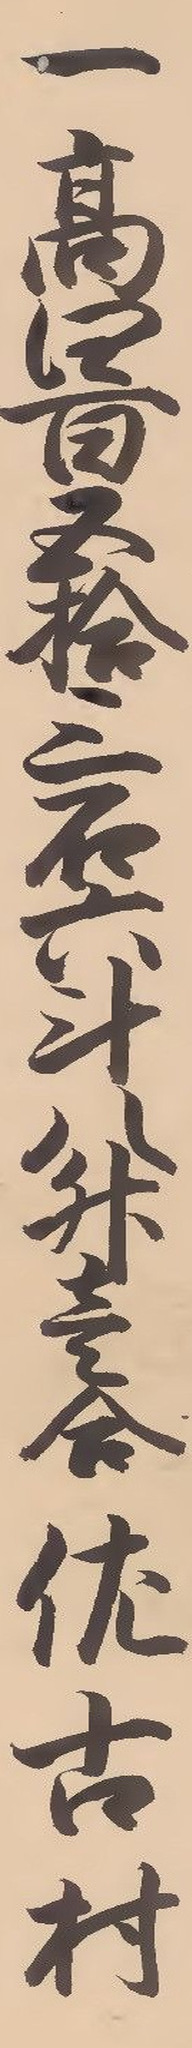一髙四百五拾三石六斗八升壱合佐古村
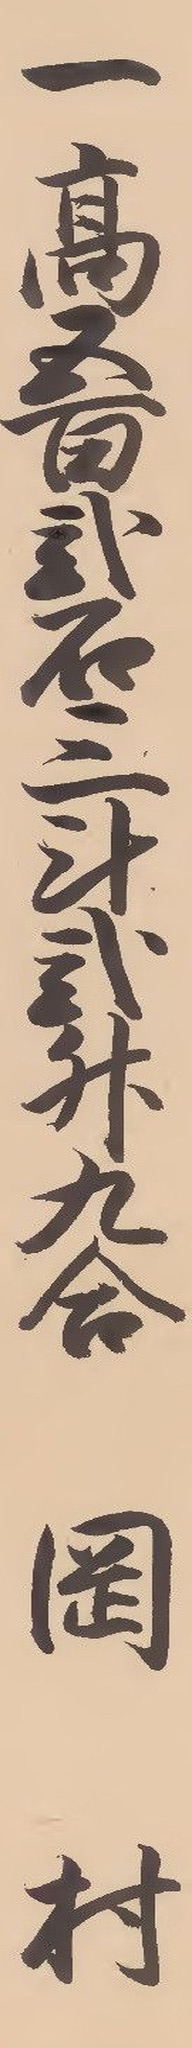一髙五百弐石三斗弐升九合岡村
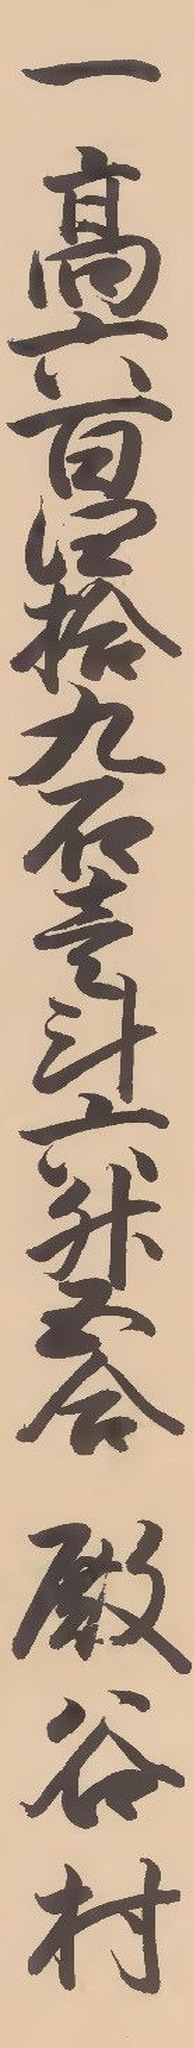一髙六百四拾九石壱斗六升五合殿谷村
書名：備前国郷帳
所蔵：国立公文書館 National Archives of Japan
